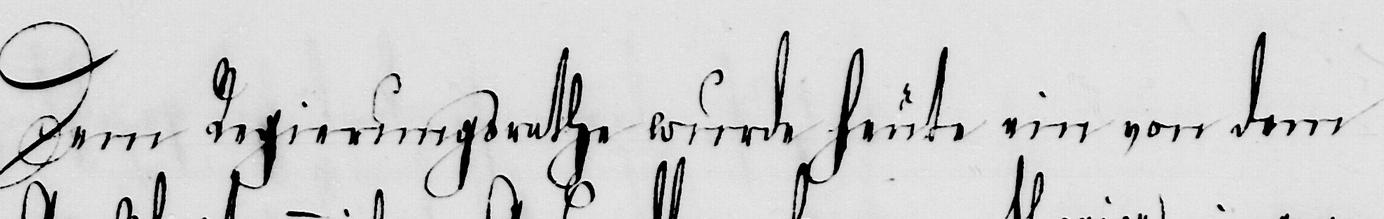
Dem Regierungsrathe wurde heute ein von dem
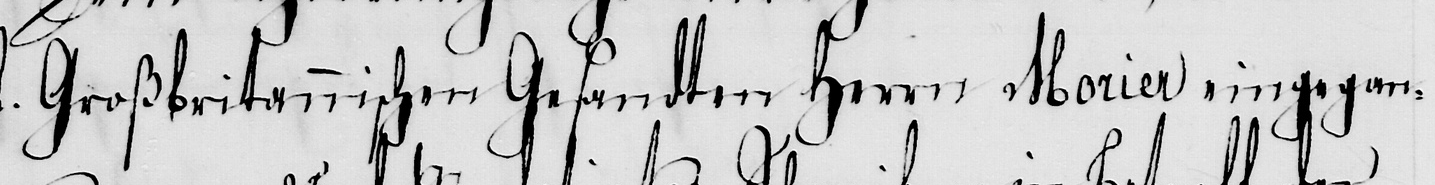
Großbritannischen Gesandten Herrn Morier eingegan¬
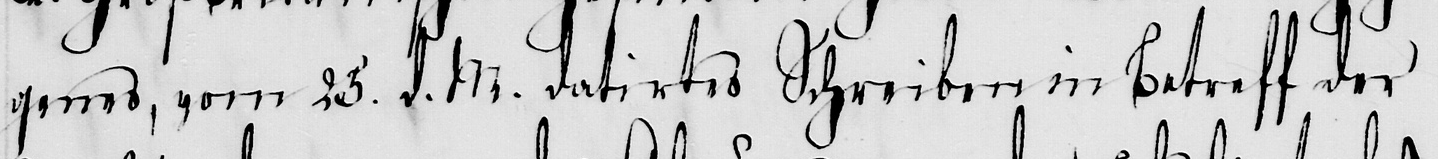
genes, vom 25. d. M. datirtes Schreiben in Betreff der
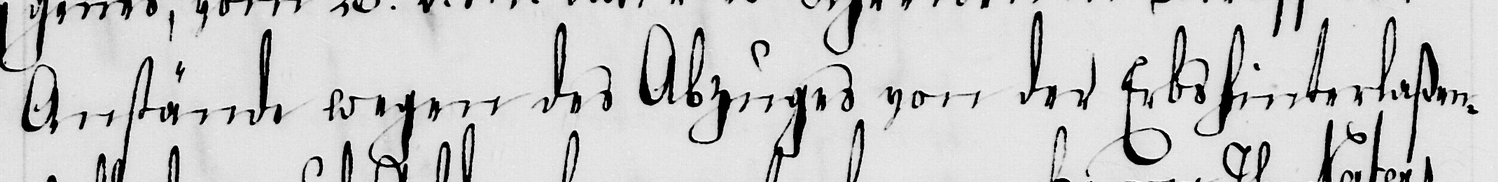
Anstände wegen des Abzuges von der Erbshinterlaßen¬
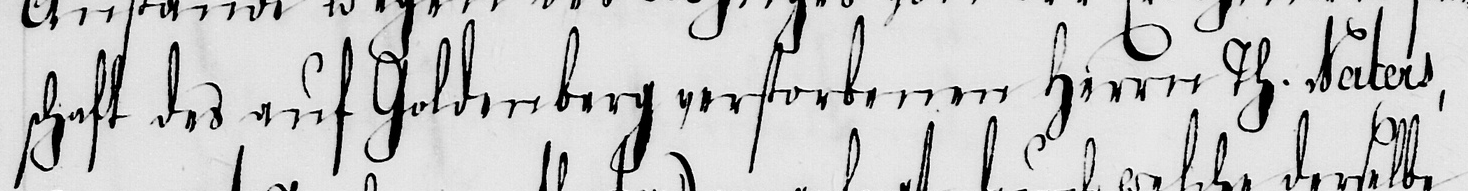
schaft des auf Goldenberg verstorbenen Herrn Th. Naters,
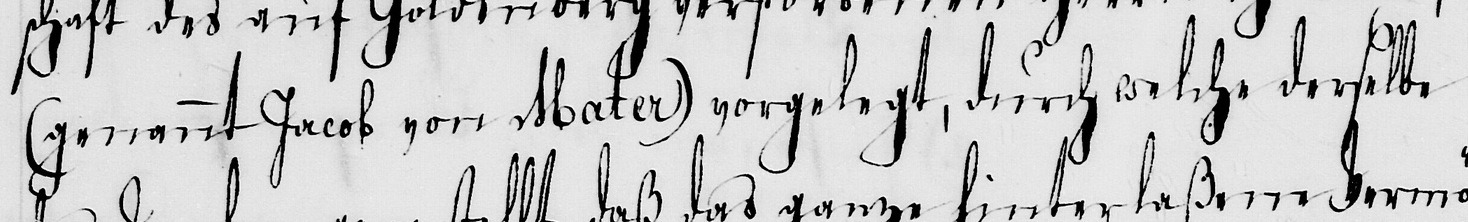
(genannt Jacob von Mater) vorgelegt, durch welche derselbe
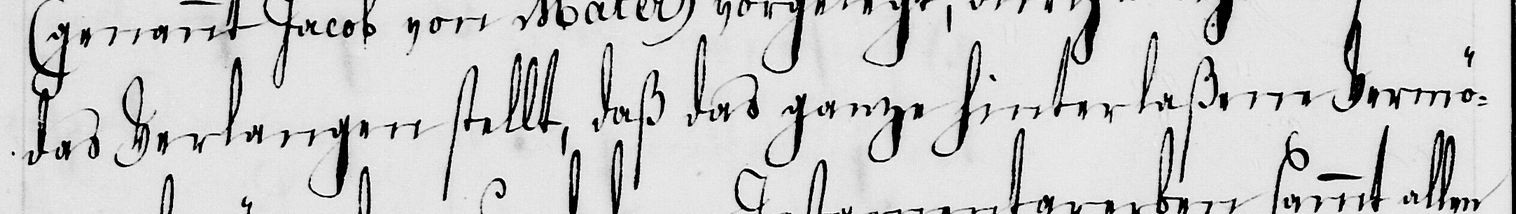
das Verlangen stellt, daß das ganze hinterlaßene Vermö¬
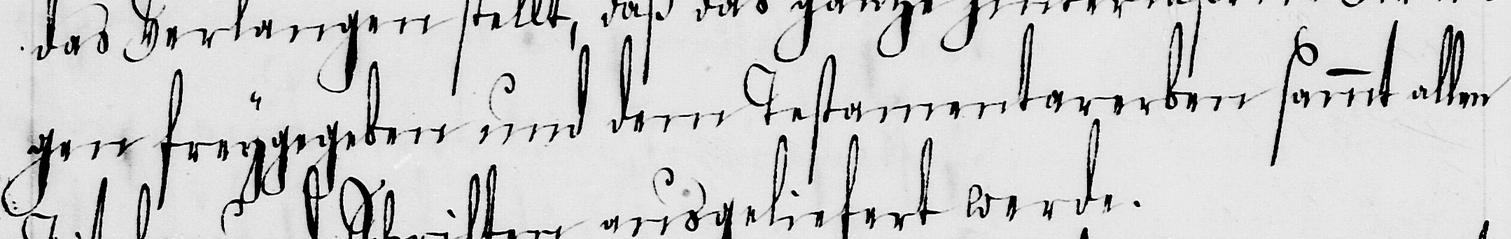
gen freygegeben und dem Testamentarerben sammt al¬
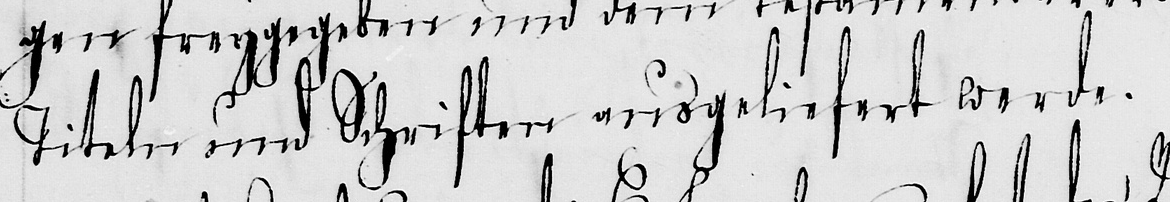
Titeln und Schriften ausgeliefert werde.
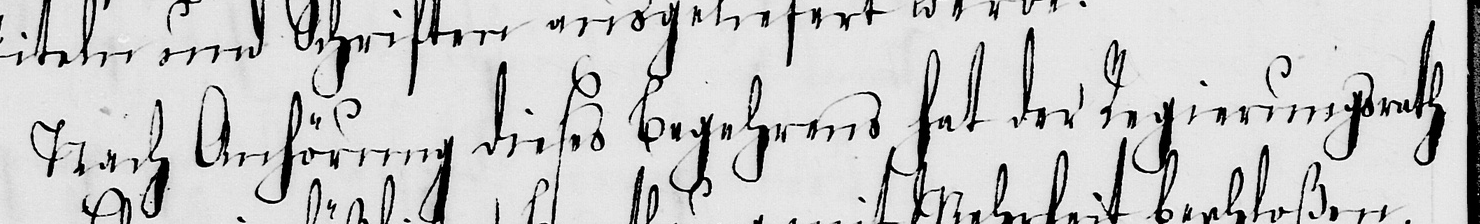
Nach Anhörung dieses Begehrens hat der Regierungsrath
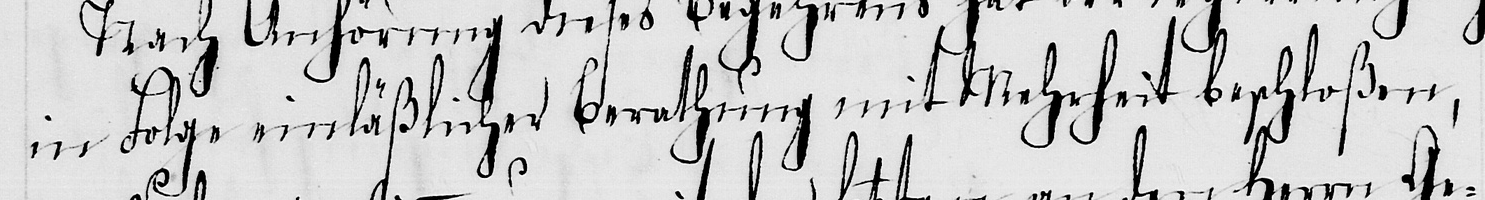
in Folge einläßlicher Berathung mit Mehrheit beschloßen,
